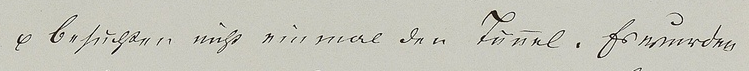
& besuchten nicht einmal den Tunnel. Es wurden
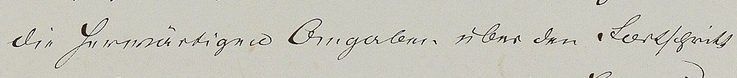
die herwärtigen Angaben über den Fortschritt
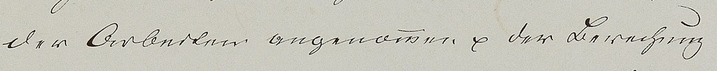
der Arbeiten angenommen & der Berechnung
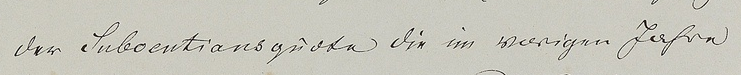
der Subventionsquote die im vorigen Jahre
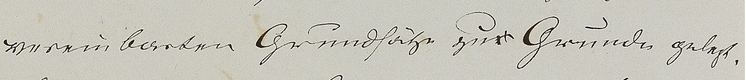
vereinbarten Grundsätze zu Grunde gelegt.
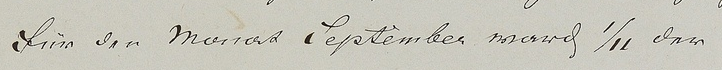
Für den Monat September ward 1/11 der
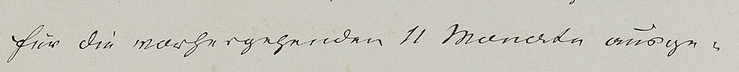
für die vorhergehenden 11 Monate ausge-
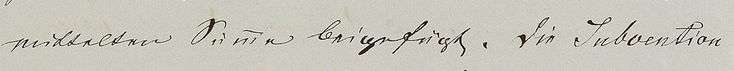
mittelten Summe beigefügt. Die Subvention
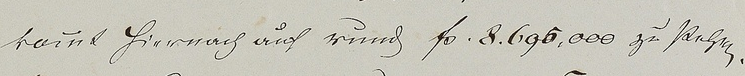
kommt hiernach auf rund Fs. 8.695,000 zu stehen.
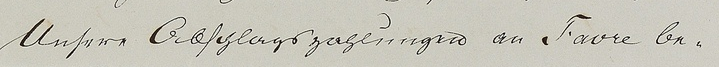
Unsere Abschlagszahlungen an Favre be-
